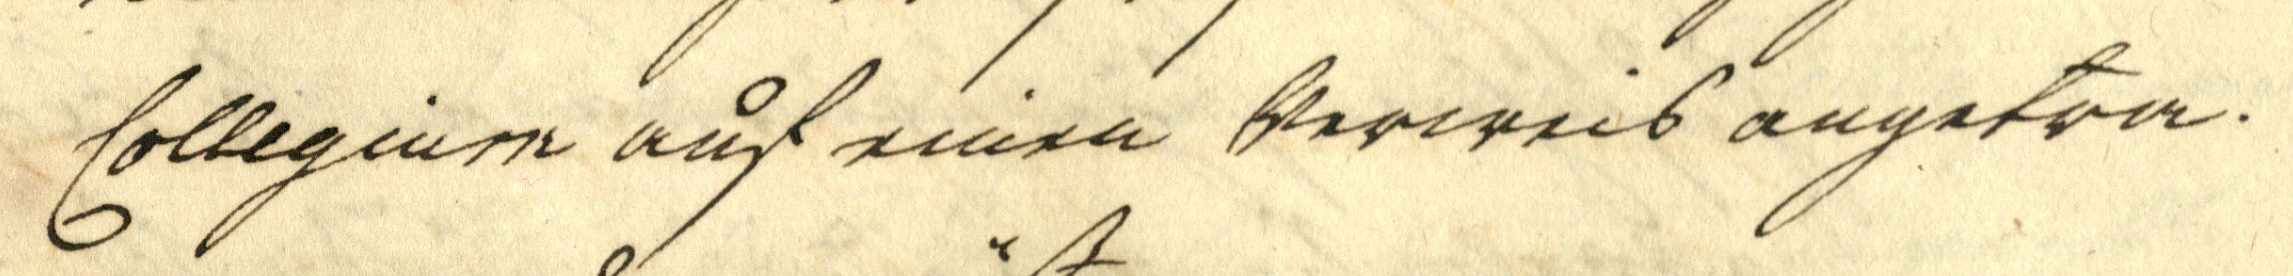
Collegium auf einen Verweis angetra¬
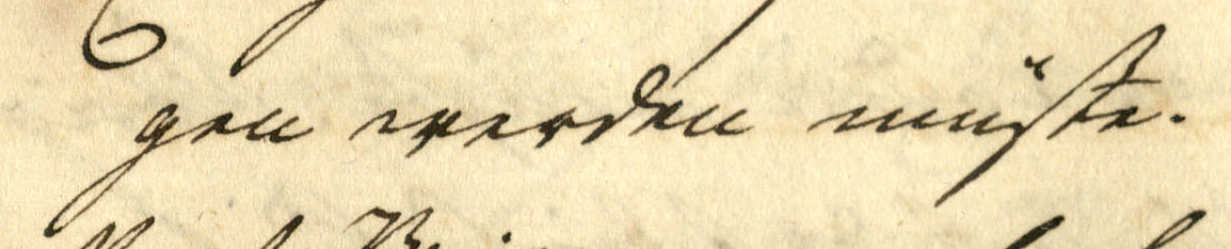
gen werden müßte.
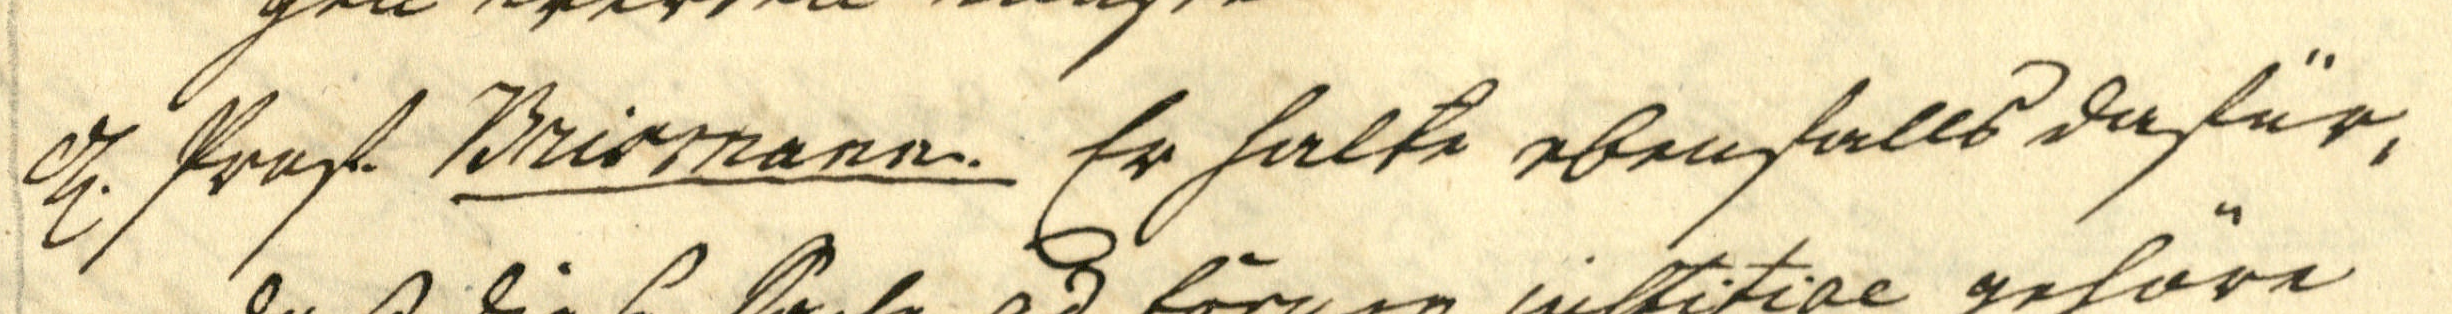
dh. Prof. Brismann Er halte ebenfalls dafür,
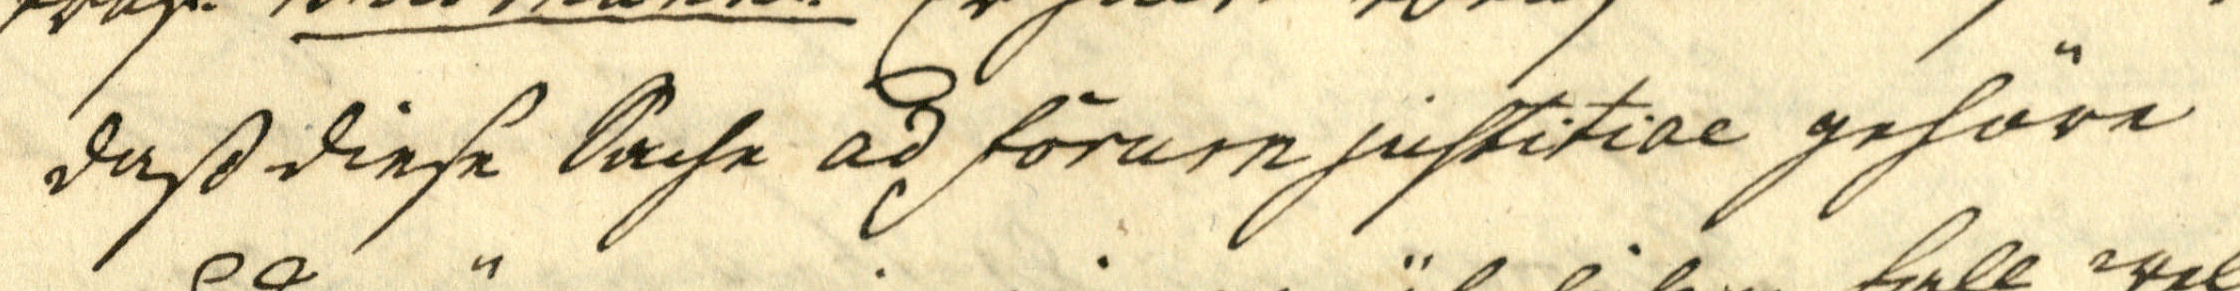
daß diese Sache ad. Forum justitiae gehöre
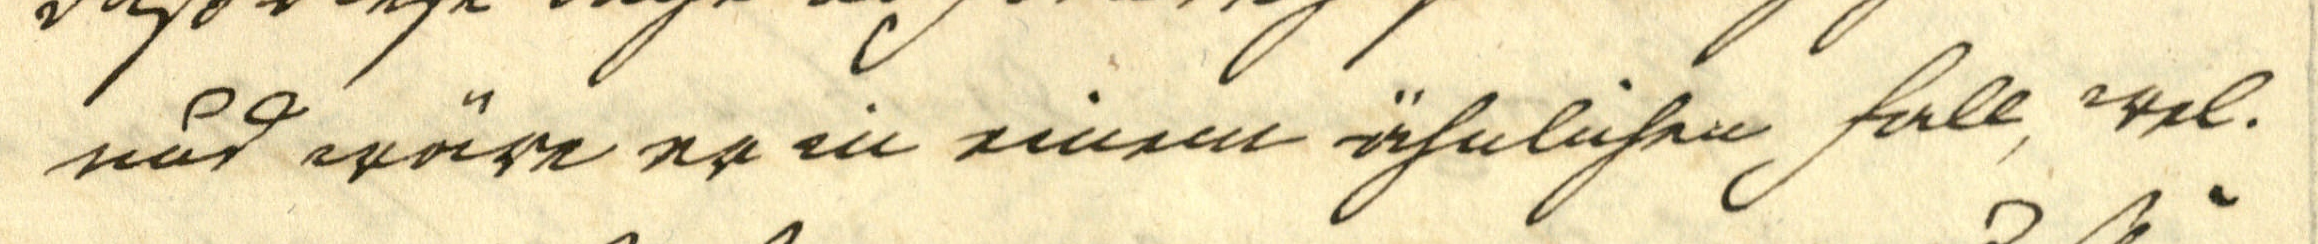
und wäre er in einem ähnlichen Fall, wel¬
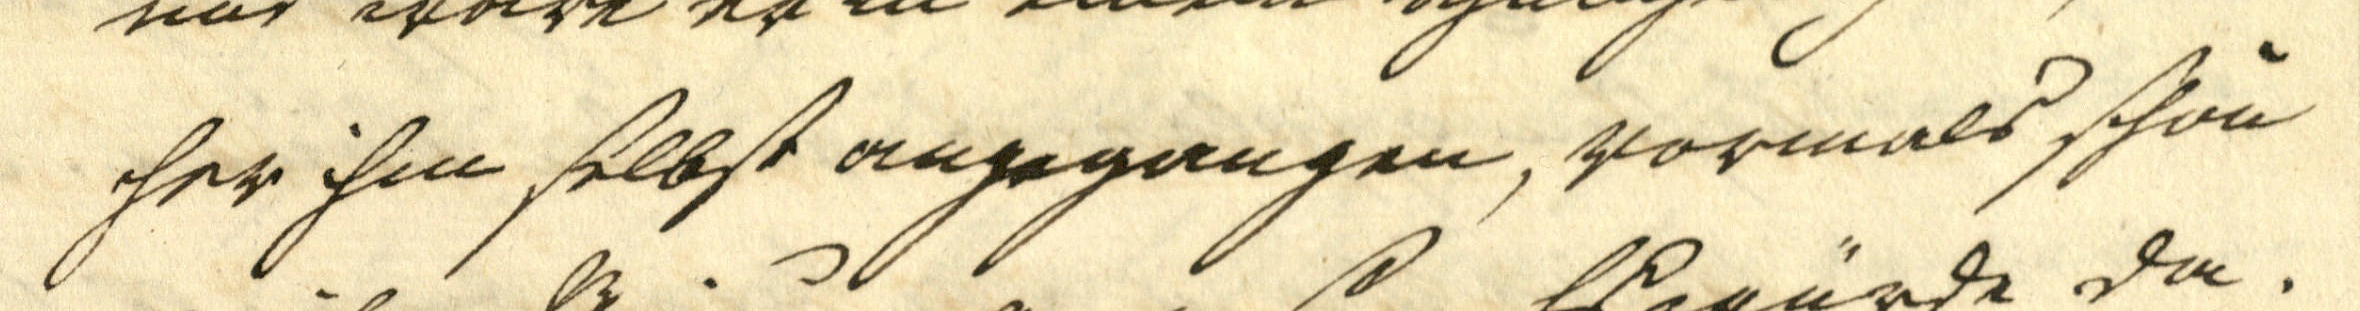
cher ihm selbst angegangen, vormals schon
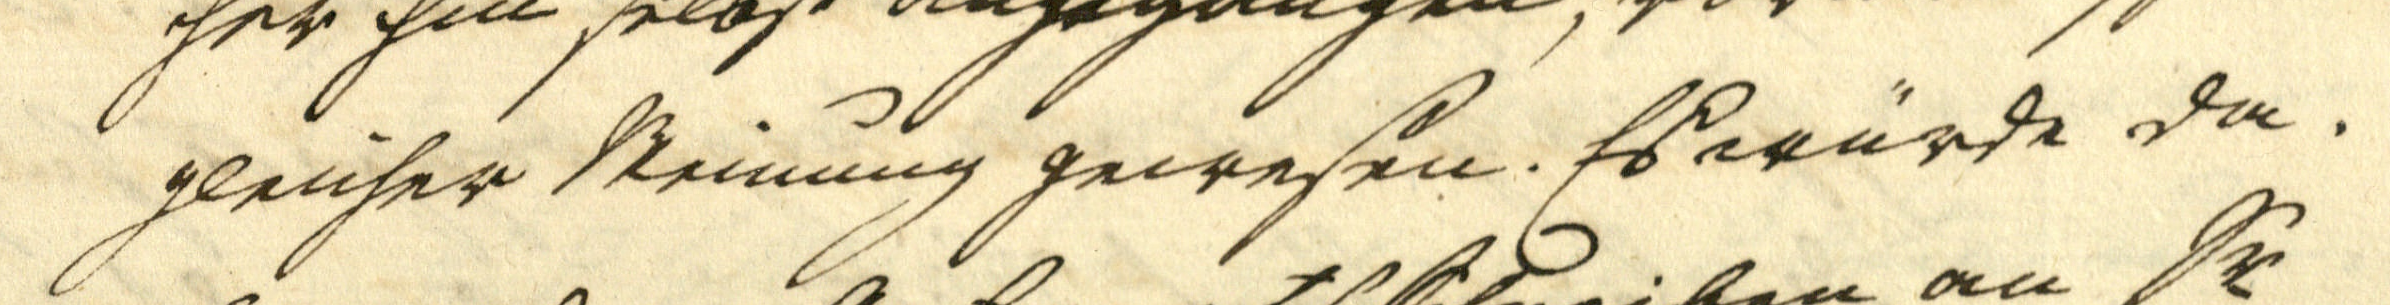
gleicher Meinung gewesen. Es würde da¬
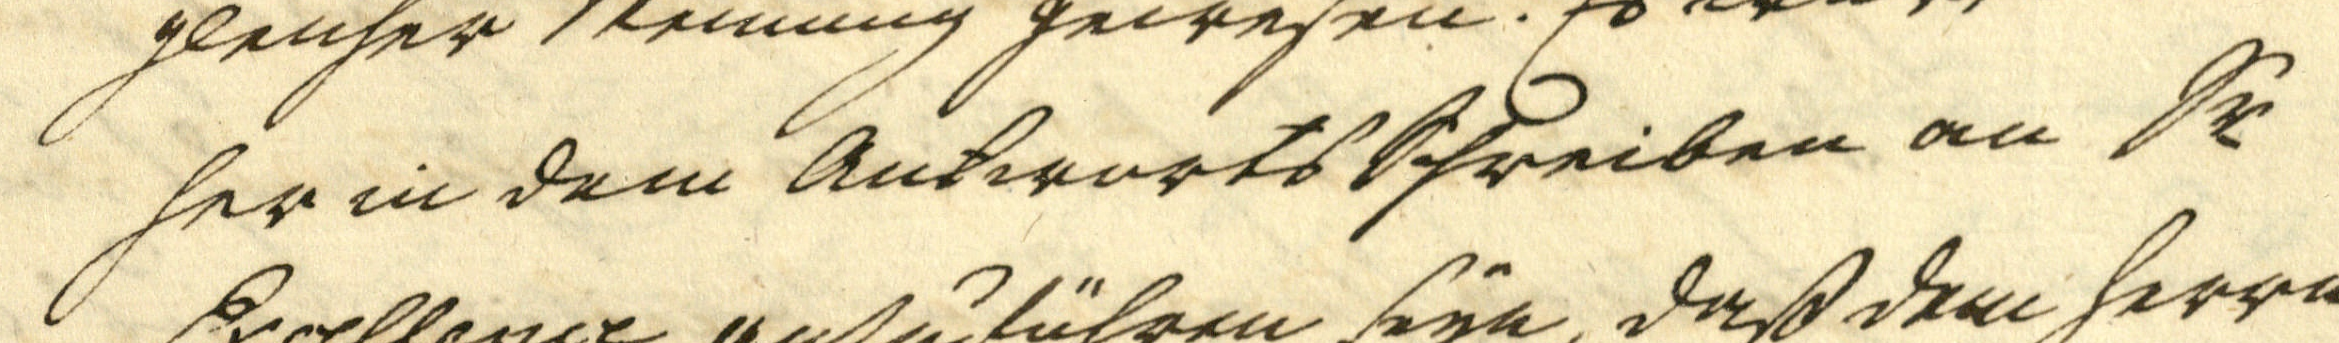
her in dem Antworts Schreiben an Sr
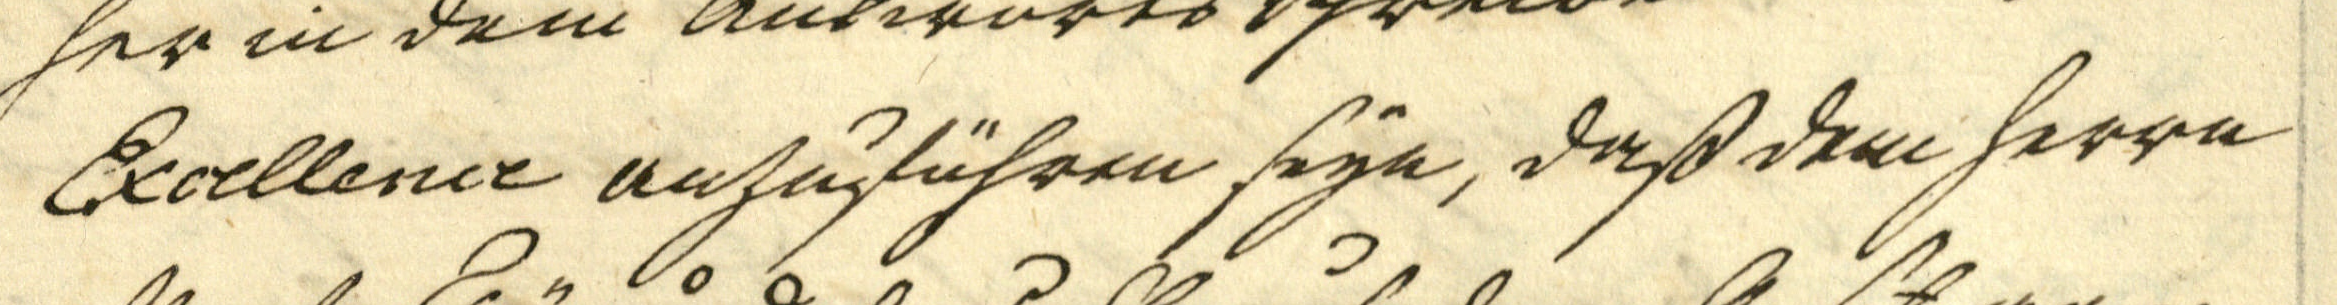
Excellence anzuführen seÿn, daß dem Herrn
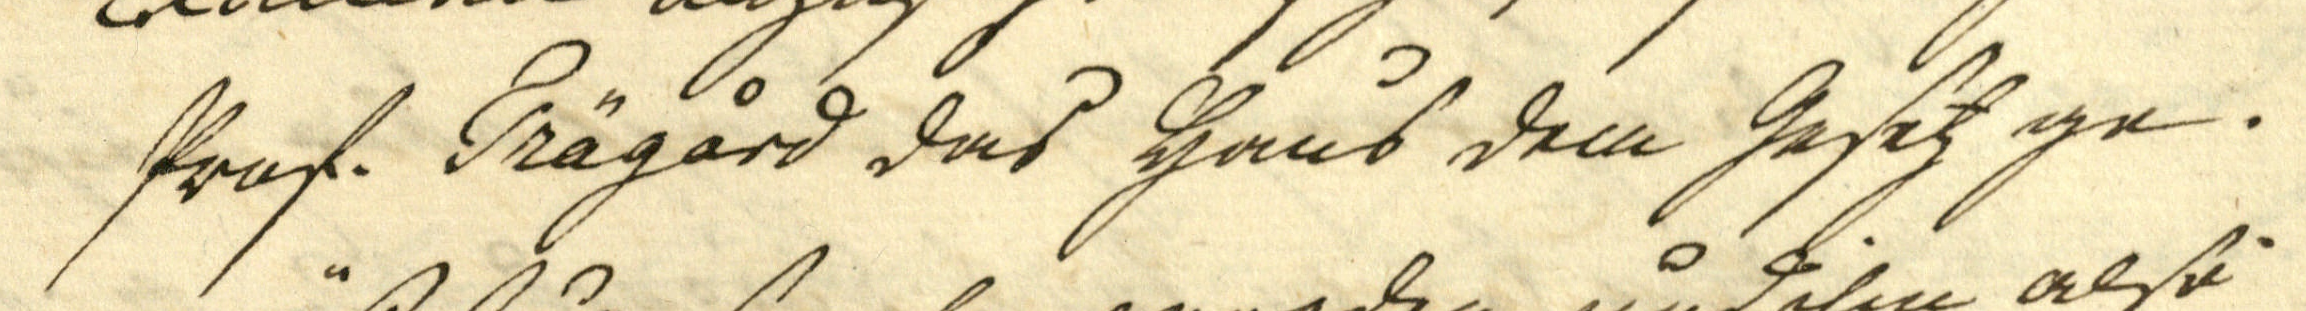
Prof. Trägård das Haus dem Gesetz ge¬
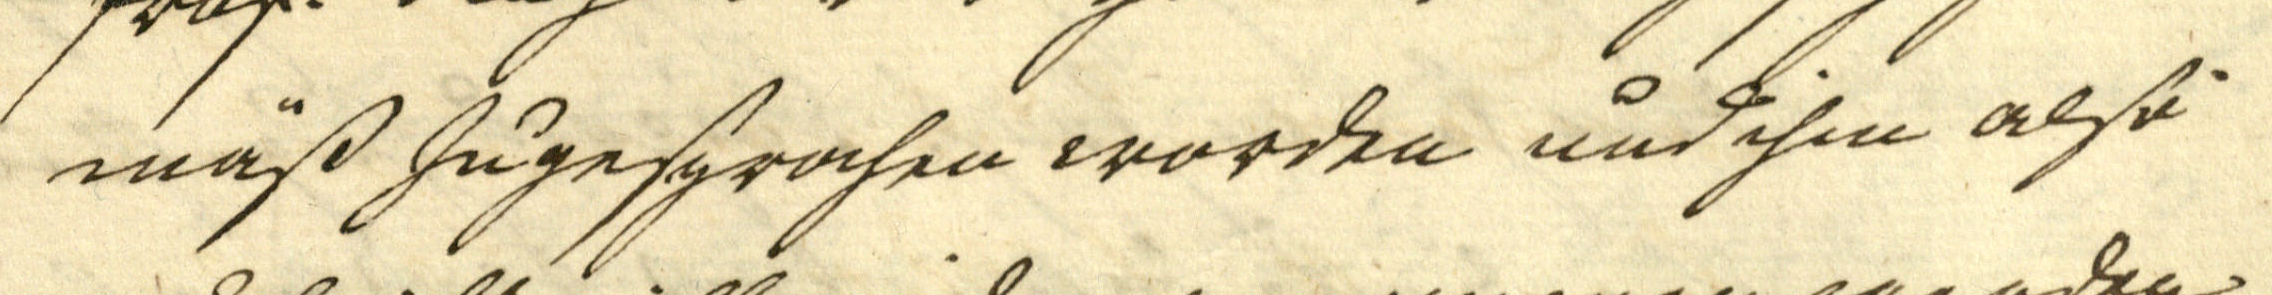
mäß zugesprochen worden und ihm also
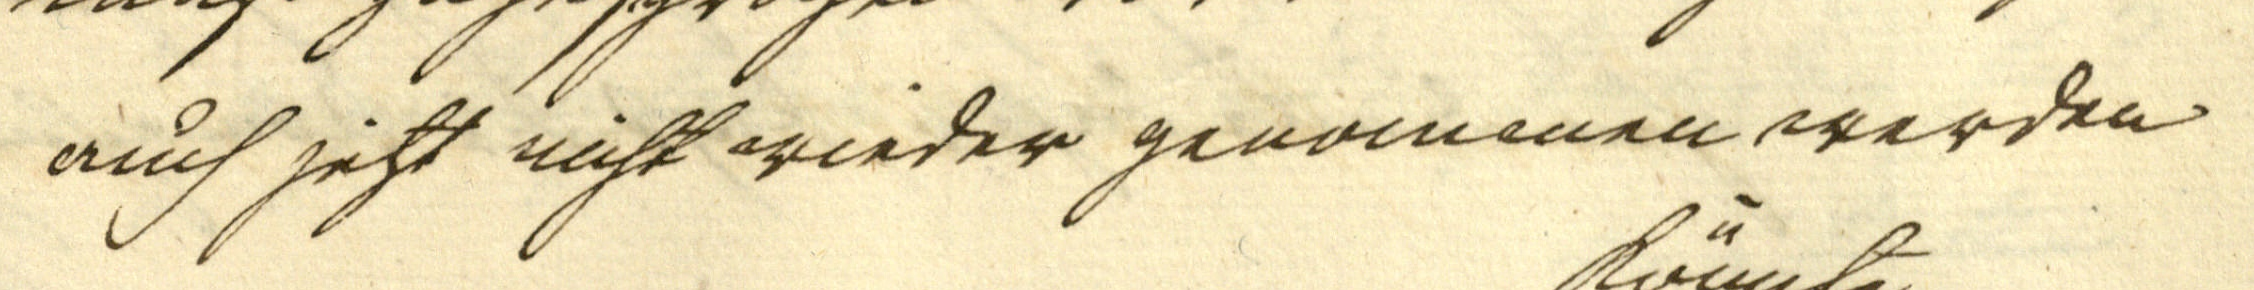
auch jetzt nicht wieder genommen werden
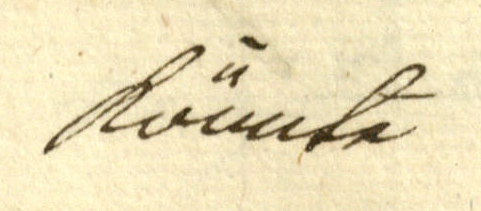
könnte
